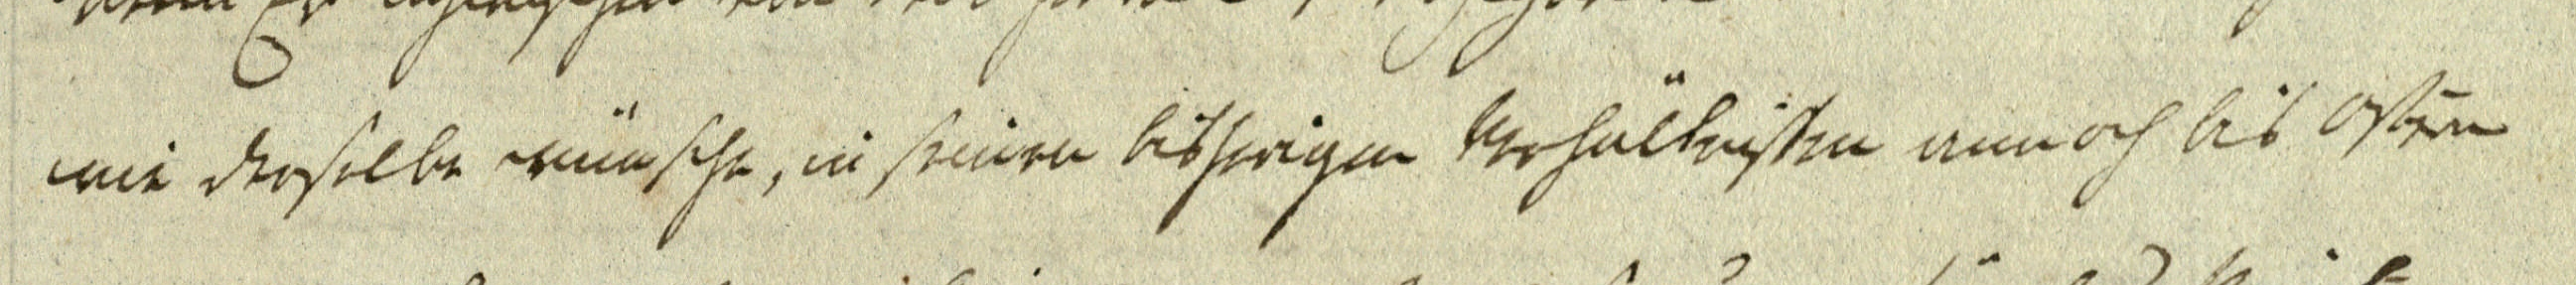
wie derselbe wünsche, in seinen bisherigen Verhältnissen annoch es Ostern
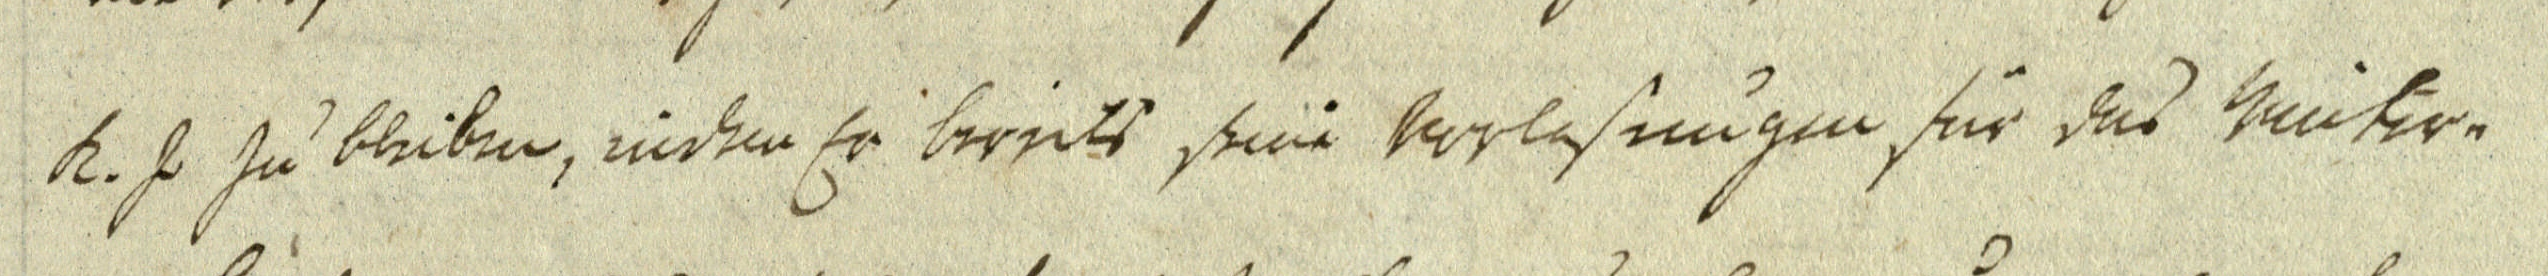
K. J. zu bleiben, indem Er bereits seine Vorlesungen für das Winter¬
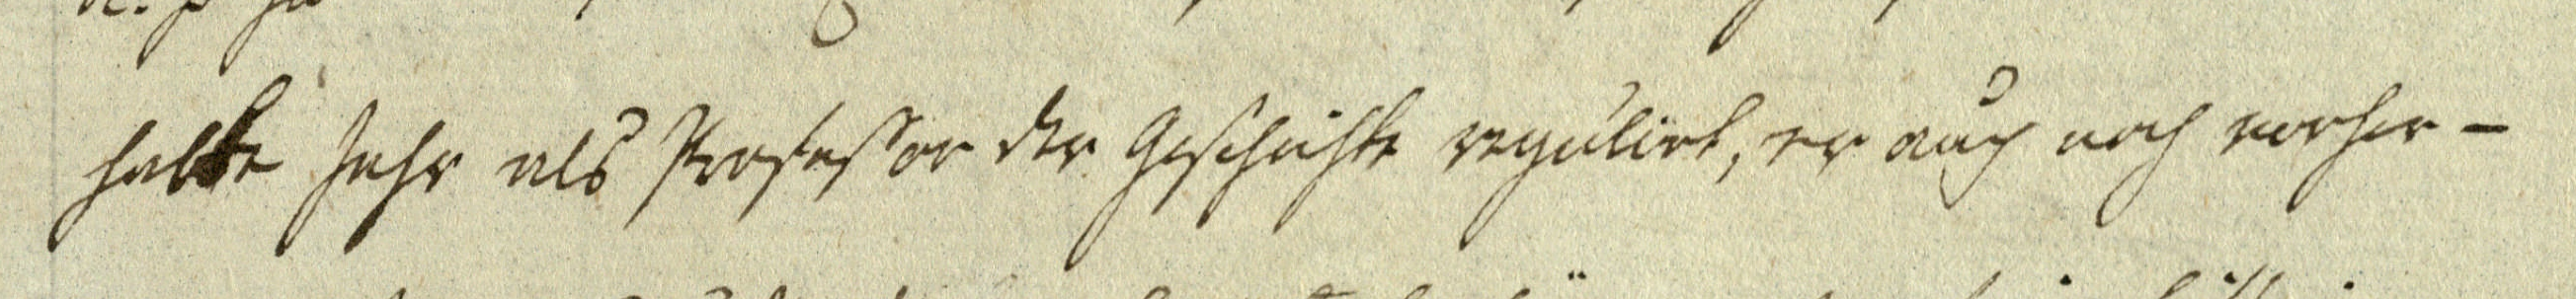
halbe Jahr als Professor der Geschichte regulirt, er auch noch vorher -
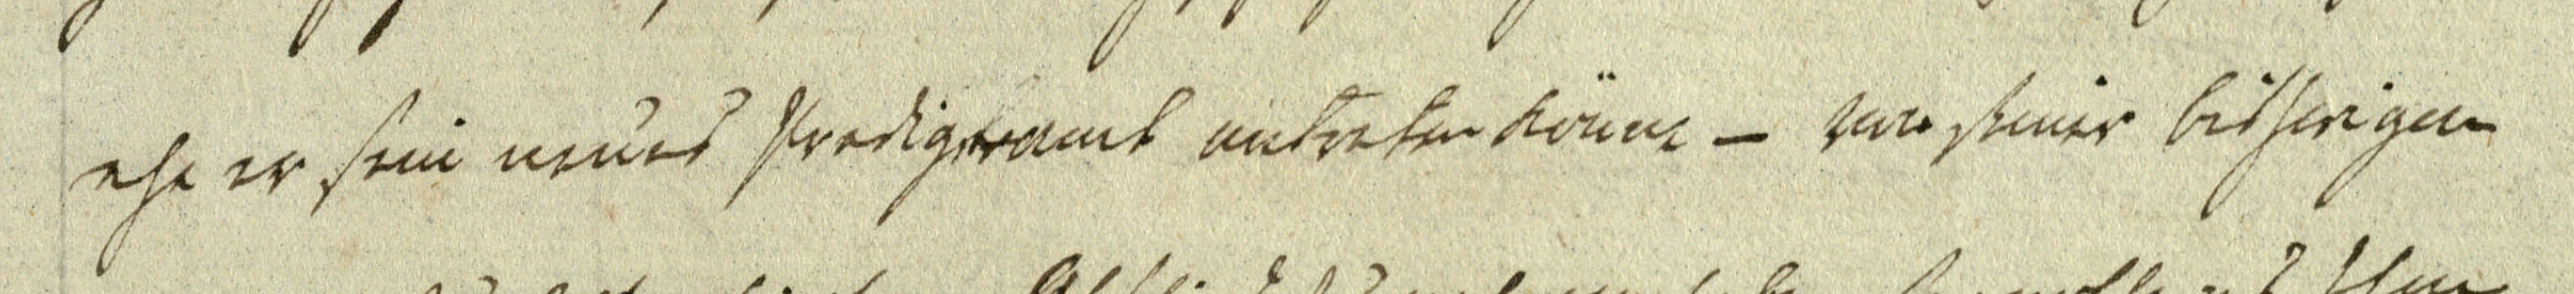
ehe er sein neues Predigeramt antreten könne - von seiner bisherigen
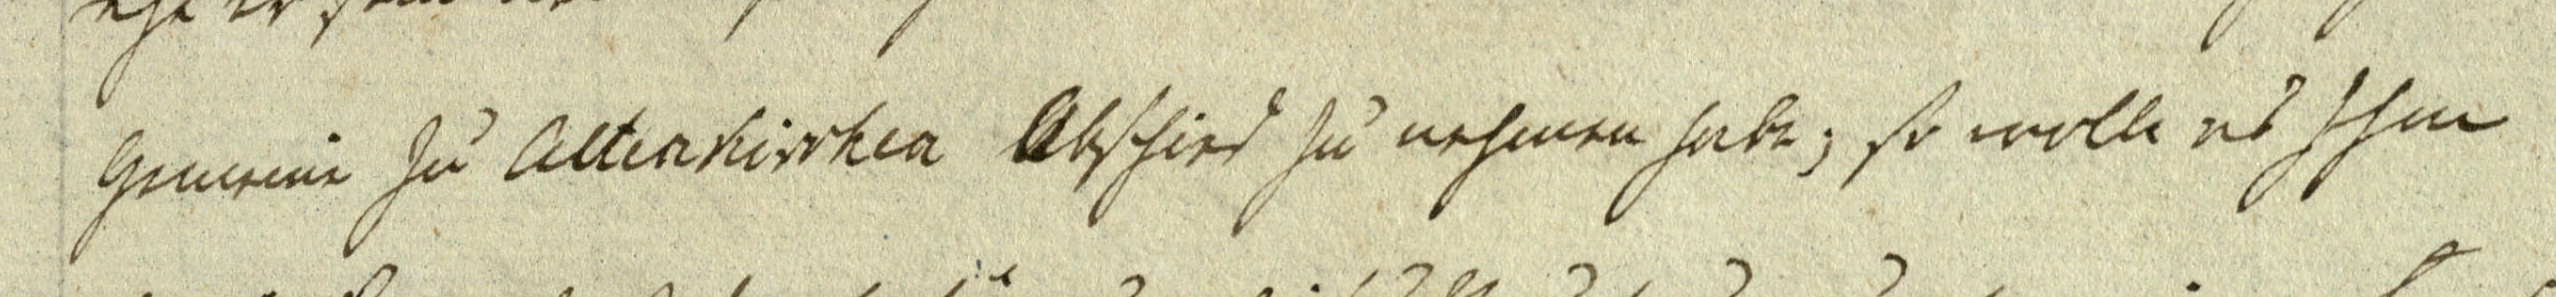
Gemeine zu Altenkirchen Abschied zu nehmen habe; so wolle es Ihm
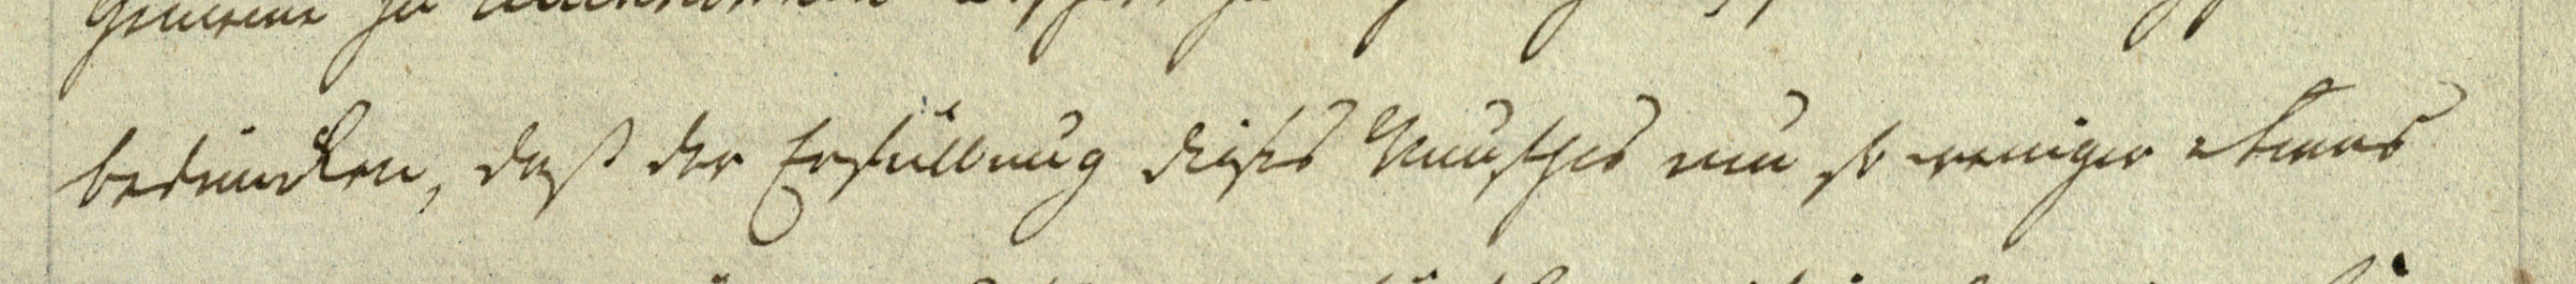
bedüncken, daß der Erfüllung dieses Wunsches um so weniger etwas
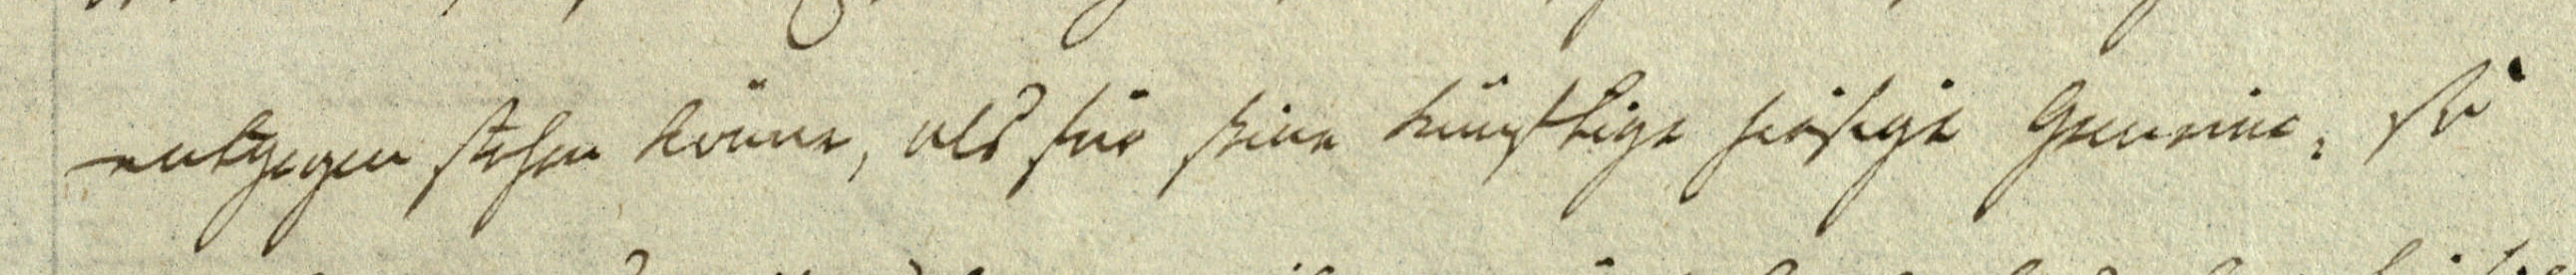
entgegen stehen könne, als für seine künftige hiesige Gemeine, so
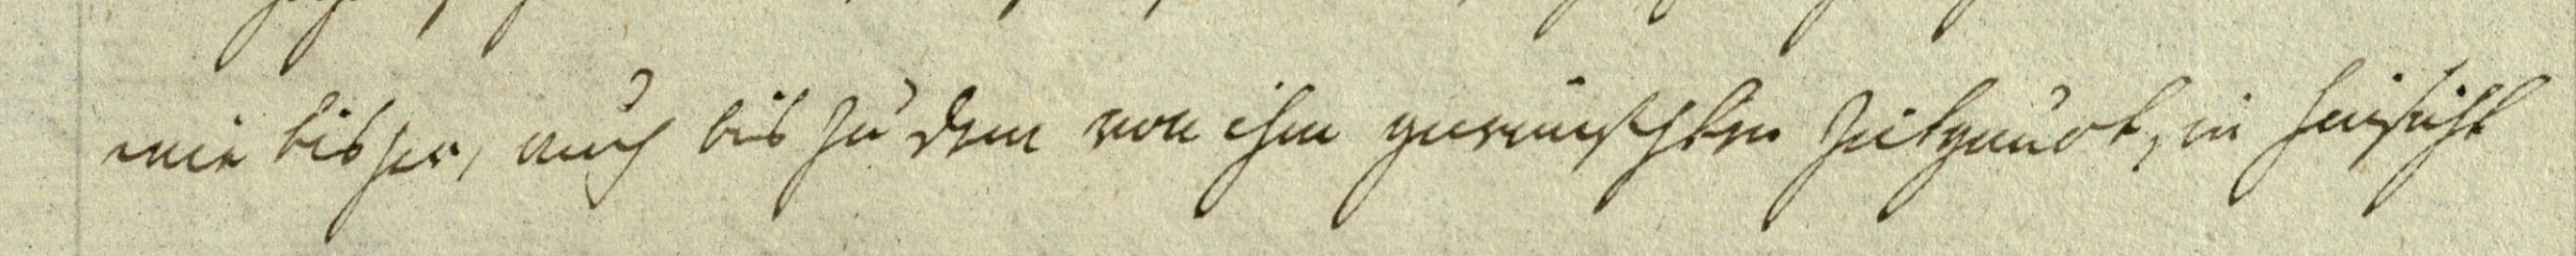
wie bisher, auch bis zu dem von ihm gewünschten Zeitpunct, in hinsicht
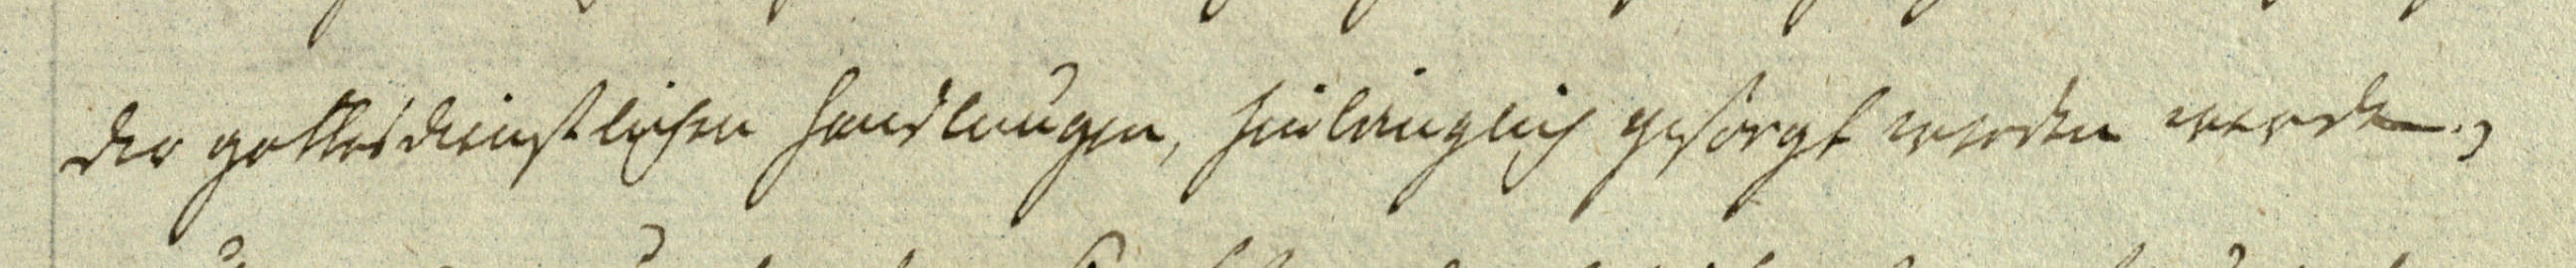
der gottesdienstlichen Handlungen, hinlänglich gesorgt werden werden,
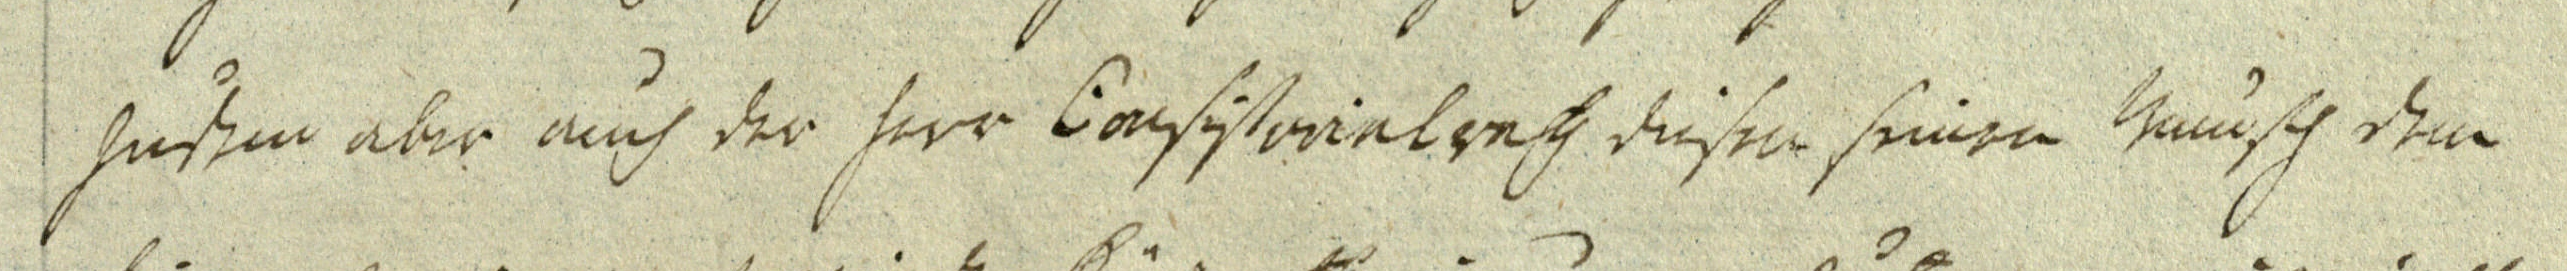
zudem aber auch der Herr Consistorialrath diesen seinen Wunsch dem
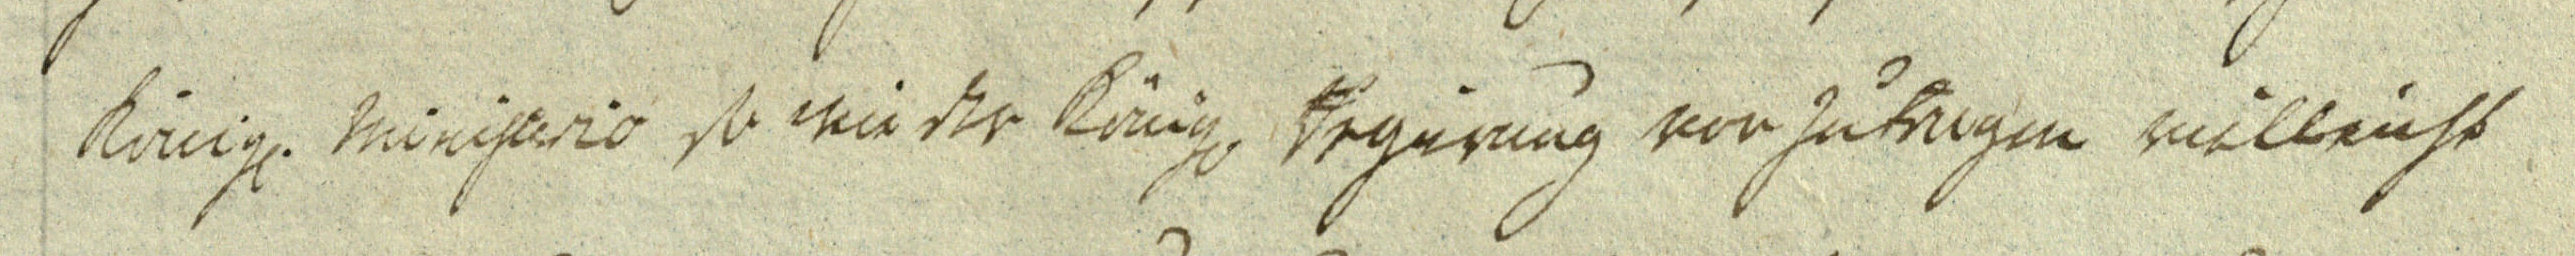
Königl. Ministerio so wie der Königl. Regierung vorzutragen vielleicht
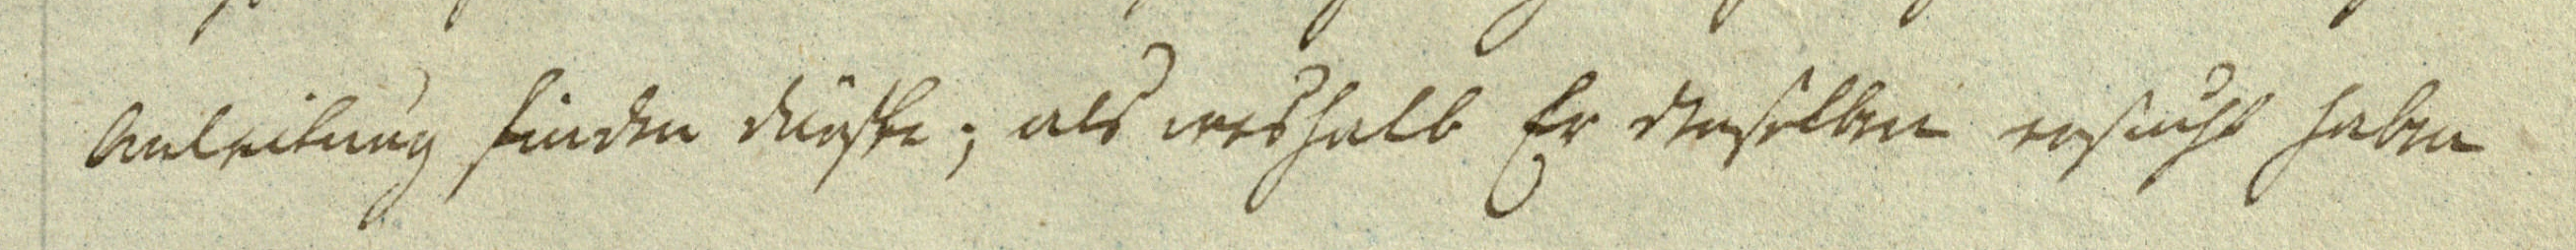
Anleitung finden dürfte; als weshalb Er denselben ersucht haben
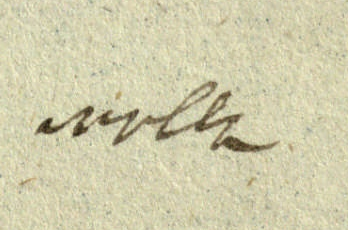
wolle
